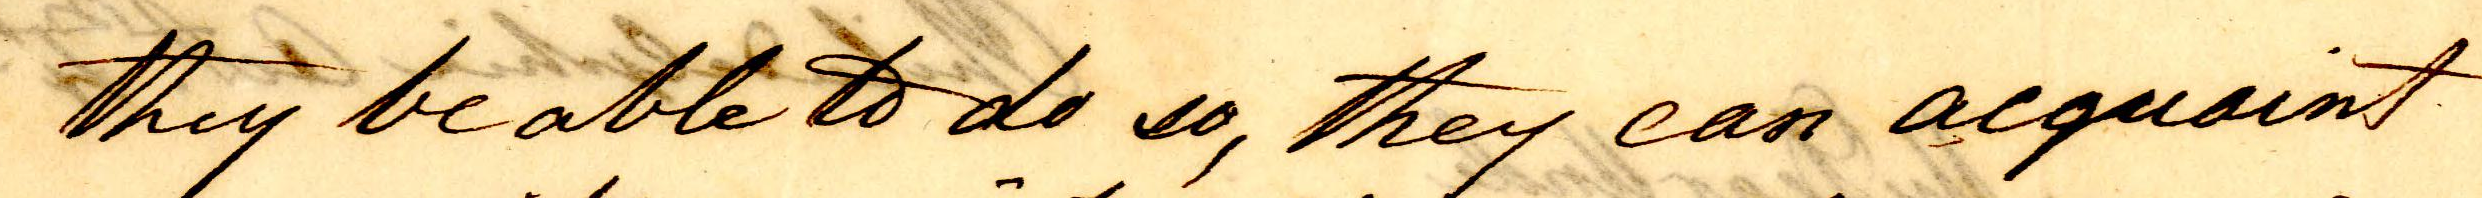they be able to do so, they can acquaint
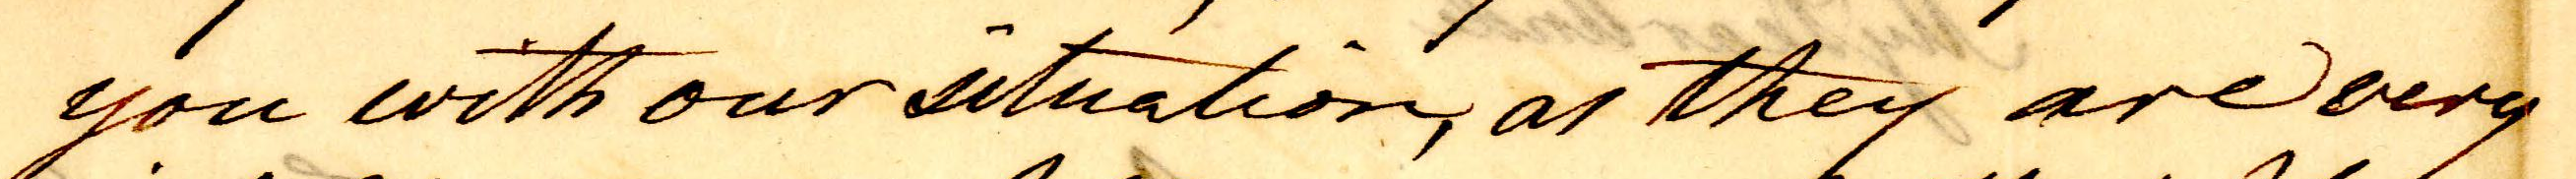you with our situation, as they are very
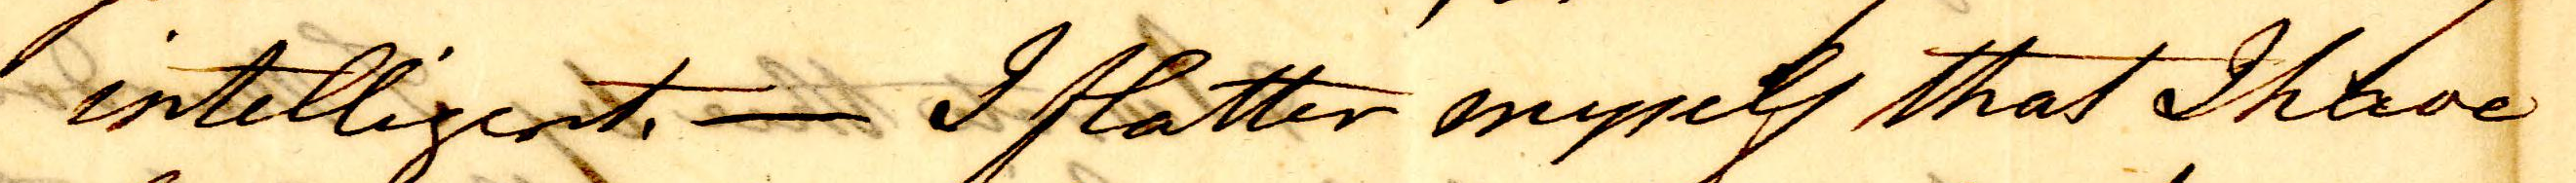intelligent.- I flatter myself that I have
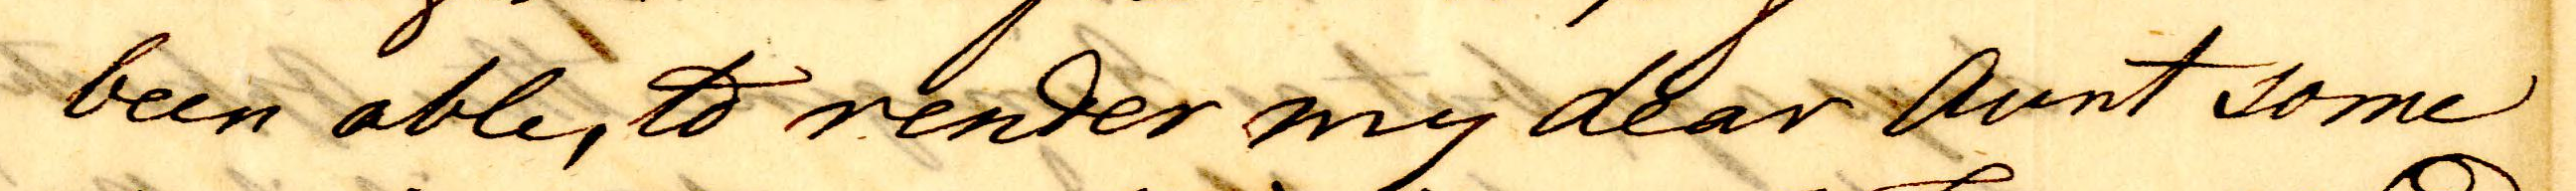been able, to render my dear Aunt some
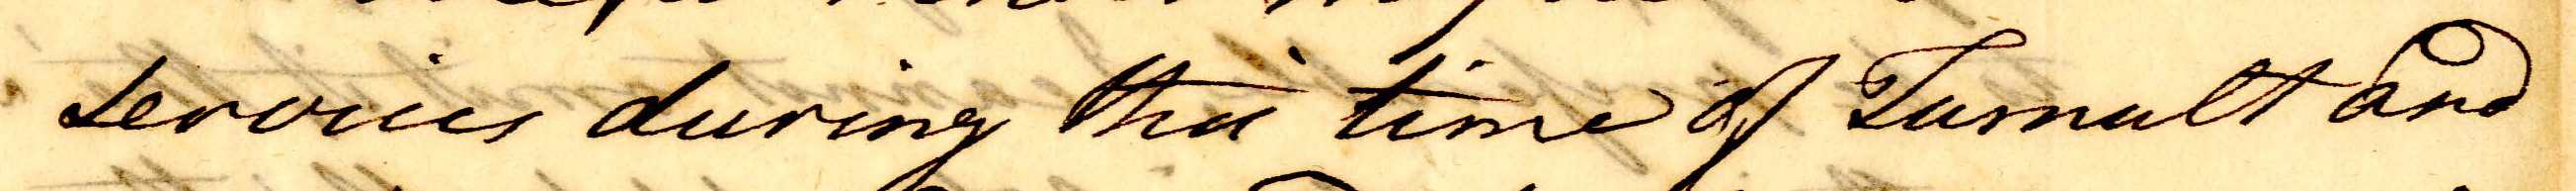services during this time of Tumult and
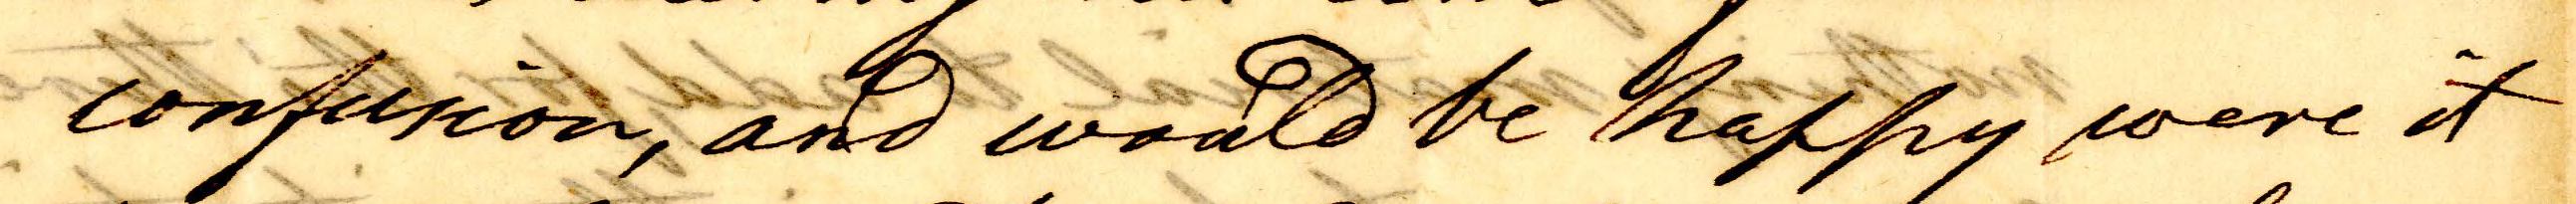confusion, and would be happy were it
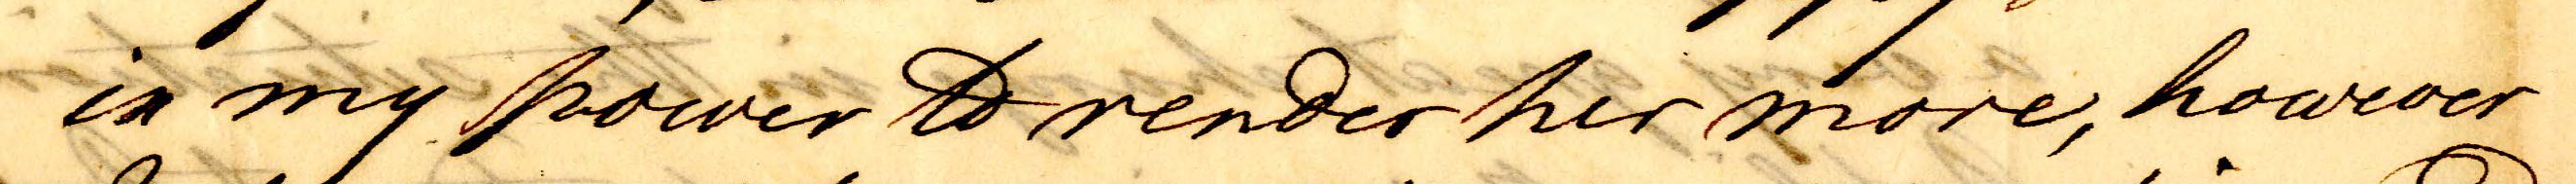in my power to render her more, however
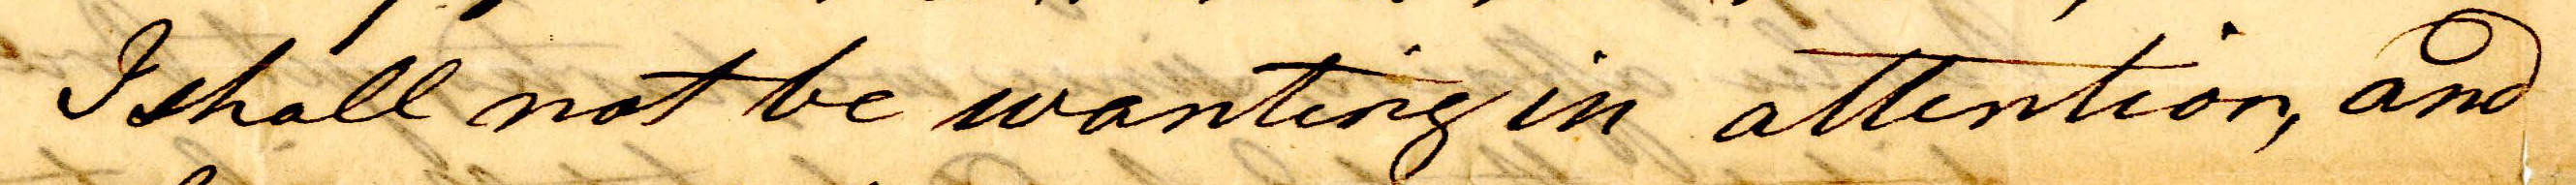I shall not be wanting in attention, and
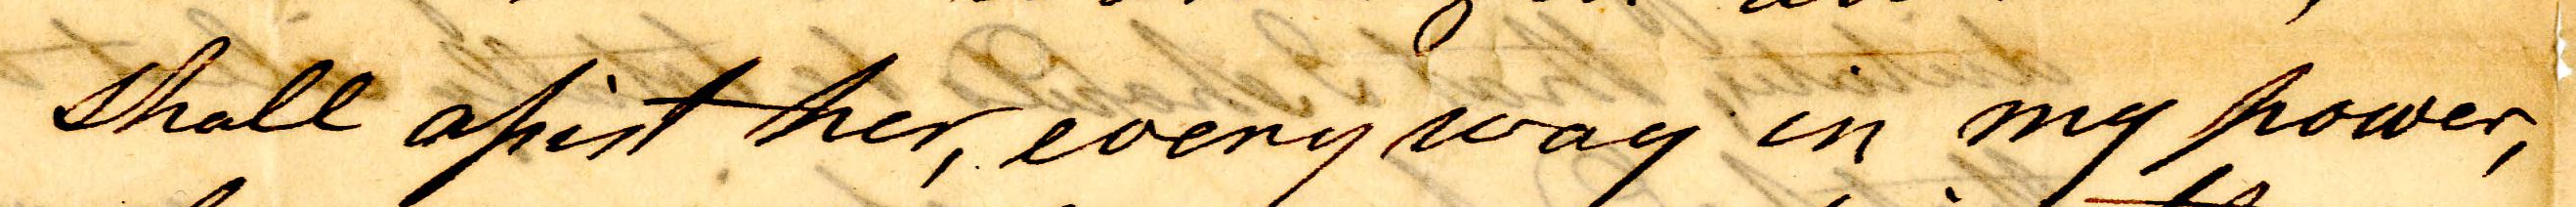shall assist her, every way in my power,
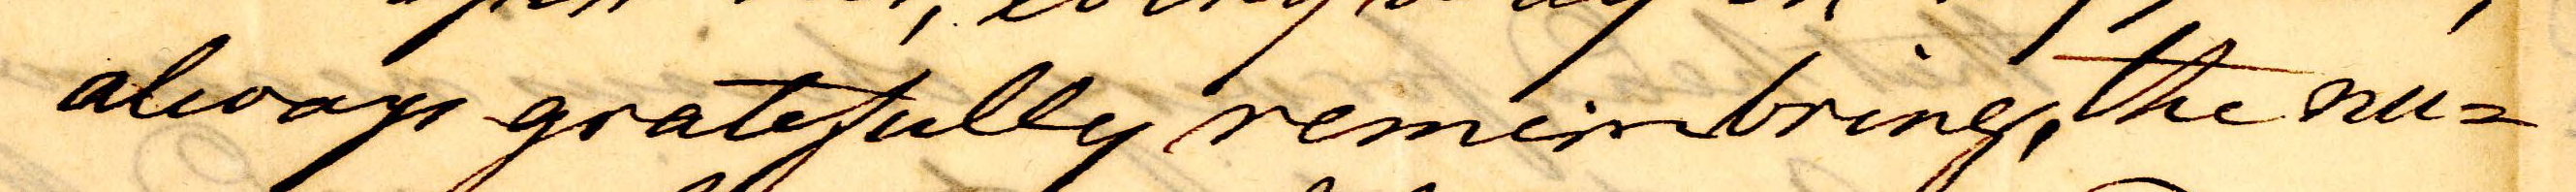always gratefully remembering, the nu-
